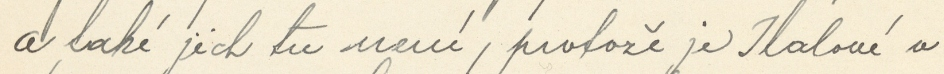a také jich tu není, protože je Italové v
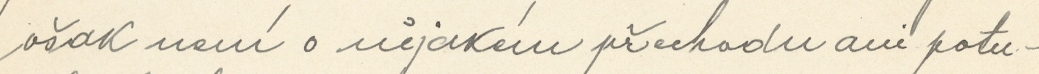však není o nějakém přechodu ani potu-
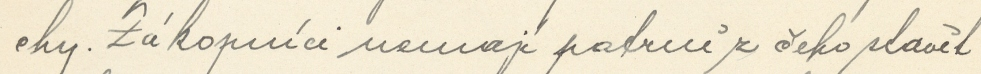chy. Zákopníci nemají patrně z čeho stavět
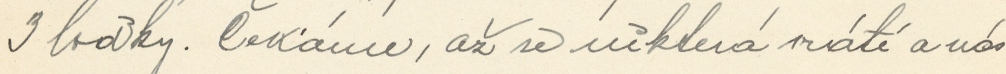3 loďky. Čekáme, až se některá vrátí a nás
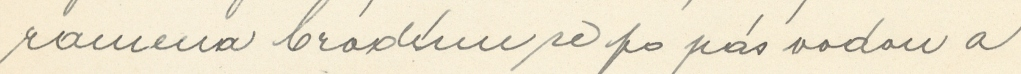ramena brodíme se po pás vodou a
